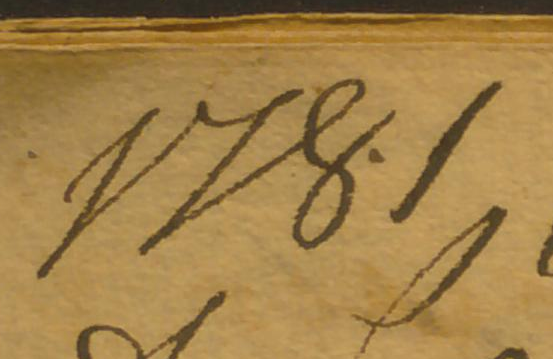1781
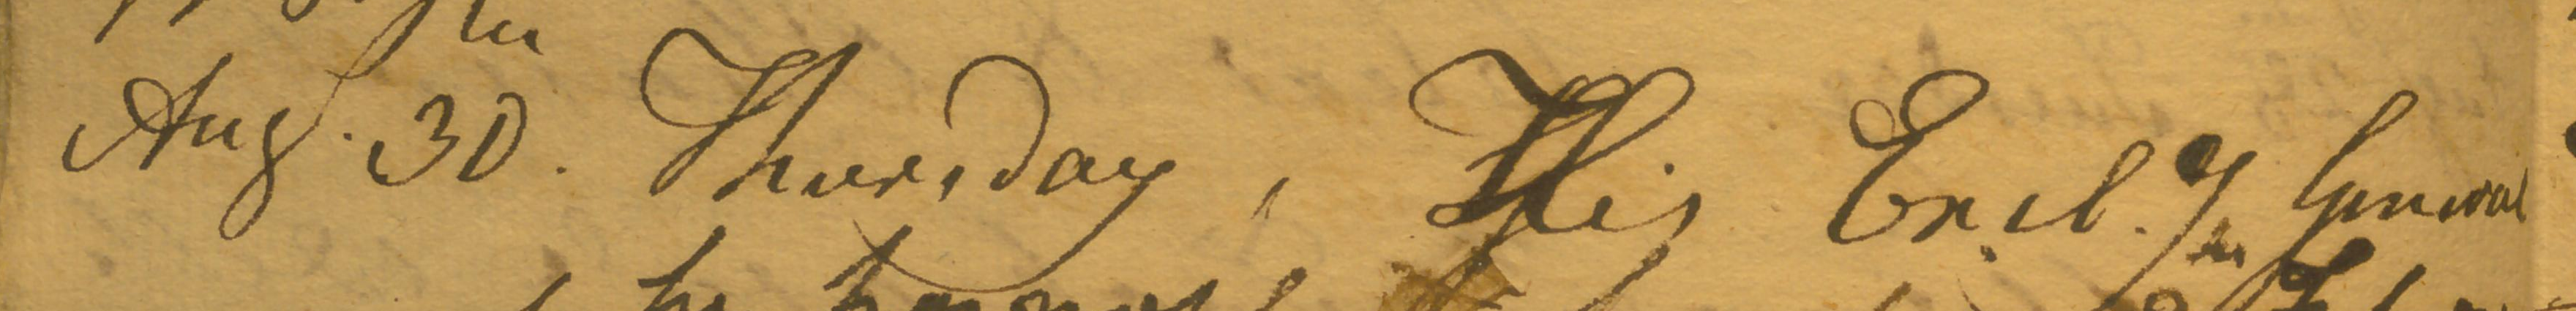Aug^t. 30^th. Thursday, His Excel^y. & General
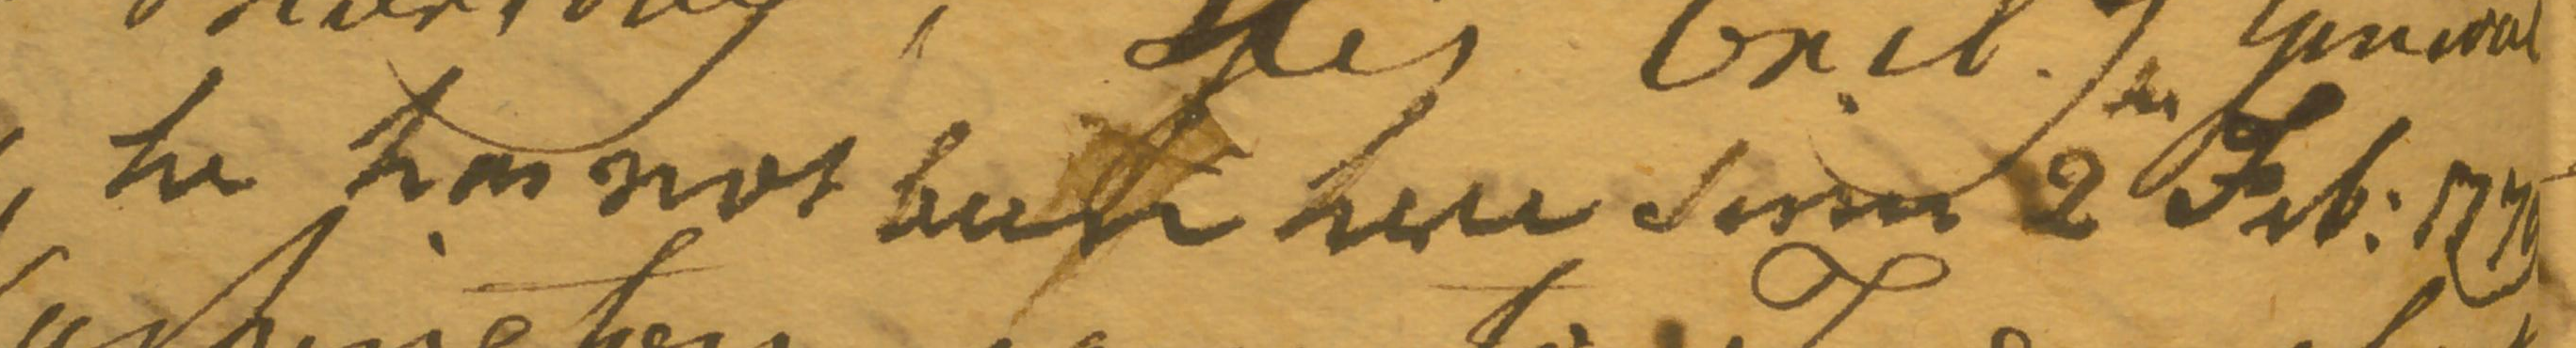he has not but hise since 2^th Feb: 1778
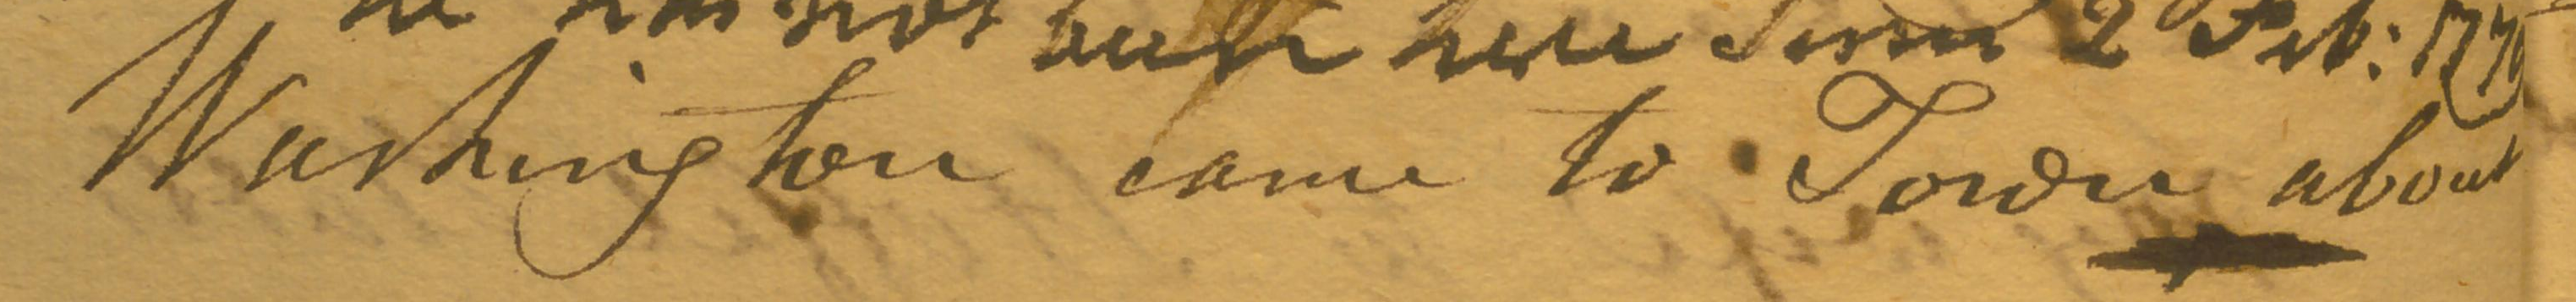Washington came to Town about
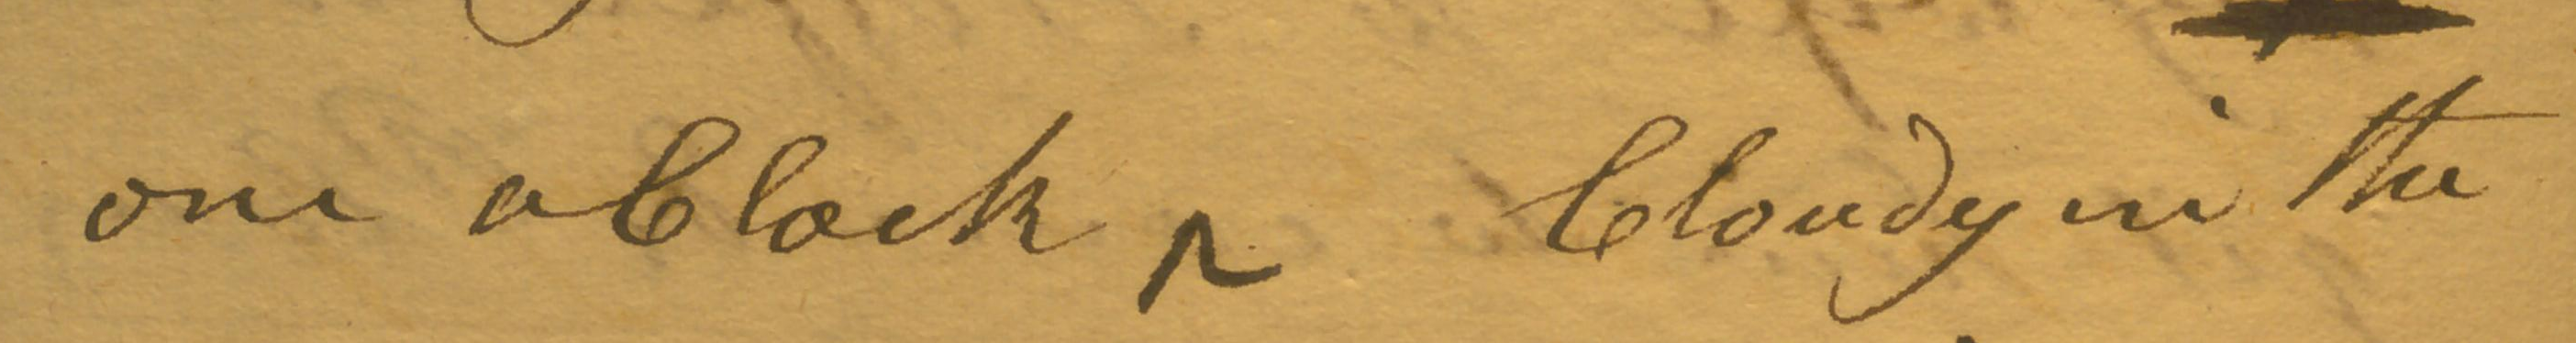one a Clock, Cloudy in the
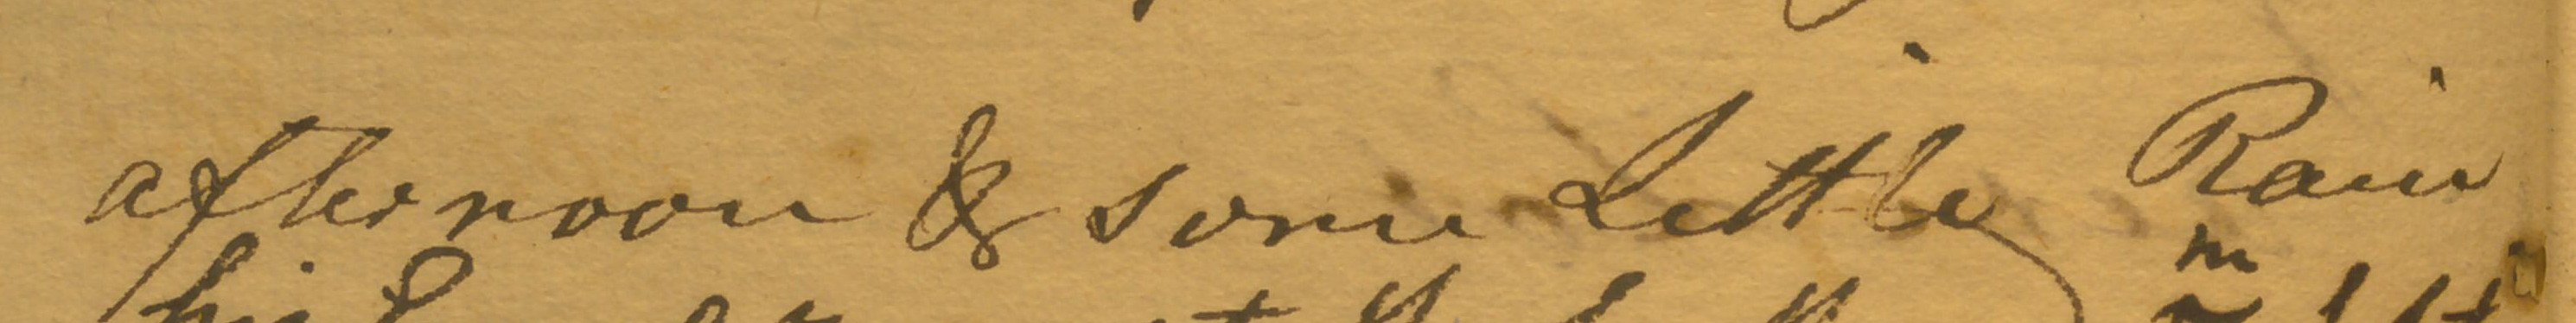afternoon & some Little Rain
